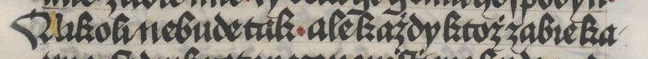Nikoli nebude tak.ale każdy ktoż zabie ka¬
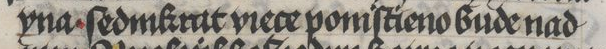yna. ſedmkrat viece pomẛṫieno bude nad
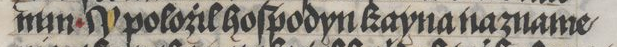ním.Y polożil hoſpodyn kayna na zname¬
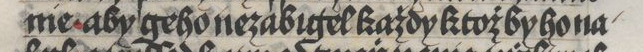níe.aby geho nezabigel każdy ktoż by ho na¬
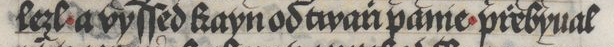lezl.a vyſſed kayn od twaṙi paníe.pṙebyual
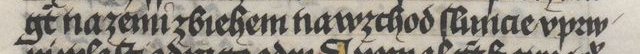ḡt na zemi zbiehem nawzchod ſluncie vprw¬
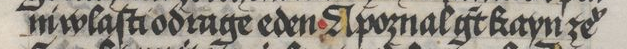ní wlaſti odrage eden.A poznal ḡt kayn zev
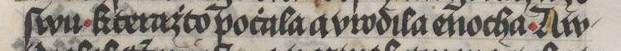ſwu.kterażto poċala a vrodila enocha.Aw¬
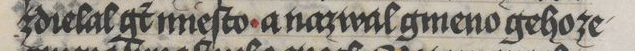zdielal ḡt mieſto.a nazwal gmeno geho ze¬
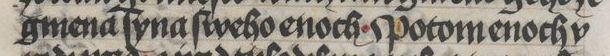gmena ſyna ſveho enoch.Potom enoch v¬
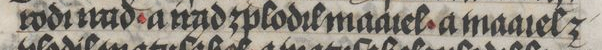rodi irad.a írad zplodil maaiel.a maaiel z¬
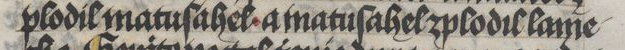plodil matuſahel.a matuſahel zplodil lame¬
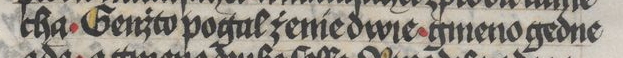cha.Genżto pogal żeníe dwie.gmeno gedne
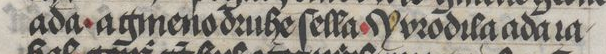ada.a gmeno druhe ſella.Y vrodila ada ia¬
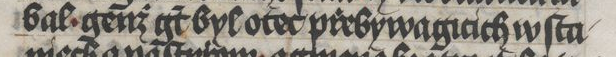bal.genż ḡt byl otec pṙebywagicich w ſta¬
